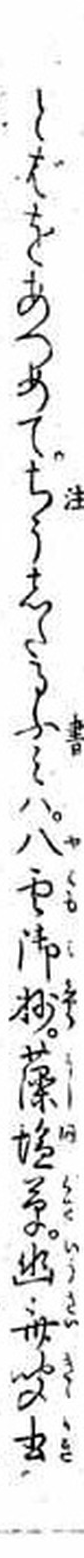とばをあつめて。ちうしたるふみは。八雲御抄。藻塩草。幽斎聞書
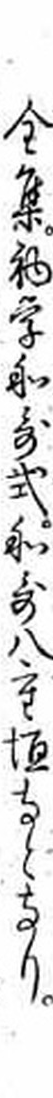全集。初学和哥式。和哥八重垣などなり。
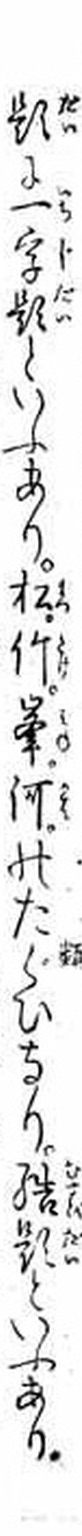題に一字題といふあり。松。竹。峯。河。のたぐひなり。結題といふあり。
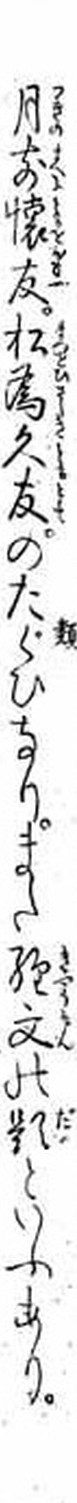月前懐友。松為久友。のたぐひなり。また経文の題といふあり。
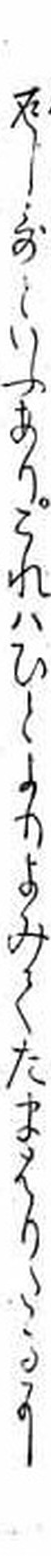返し哥といふあり。これはひとよりよみてたまはりたるに
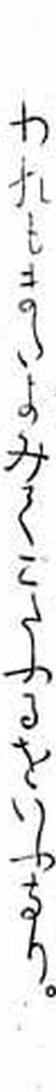われもまたよみてこたふるをいふなり。
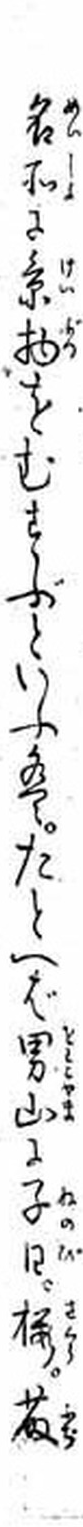名所に景物をむすぶといふは。たとへば男山に子日。桜。藤
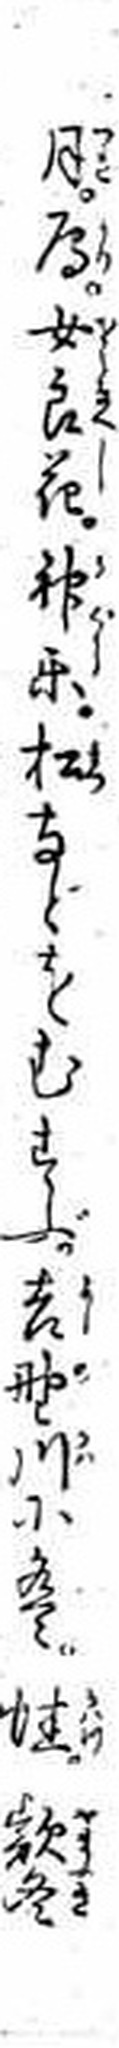月。鳫。女郎花。神楽。松などをむすぶ。吉野川には。蛙。款冬
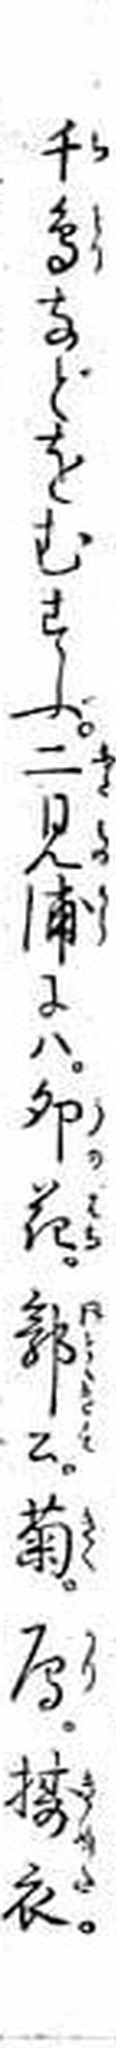千鳥などをむすぶ。二見浦には。卯花。郭公。菊。鳫。擣衣。
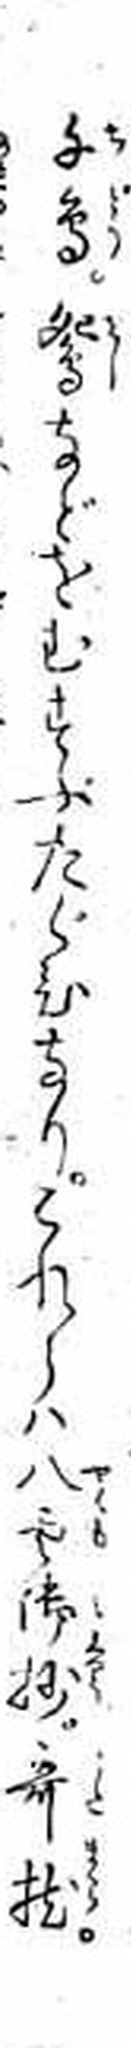千鳥。鴛などをむすぶたぐひなり。これらは八雲御抄。哥枕。
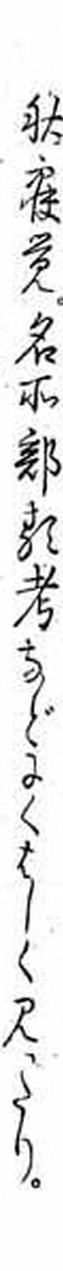秋寐覚。名所部類考などにくはしく見えたり。
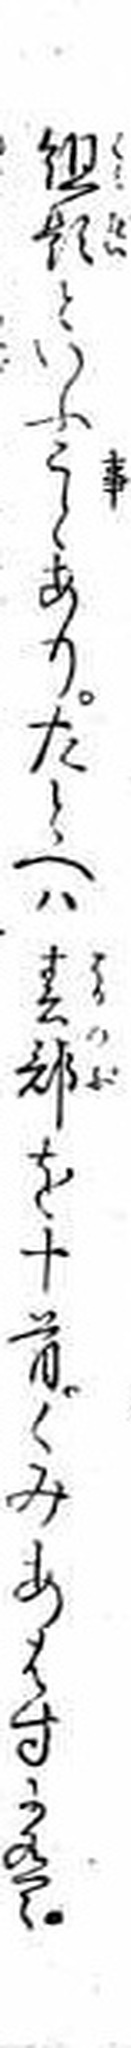組題といふことあり。たとへは春部を十首。くみあはすには。
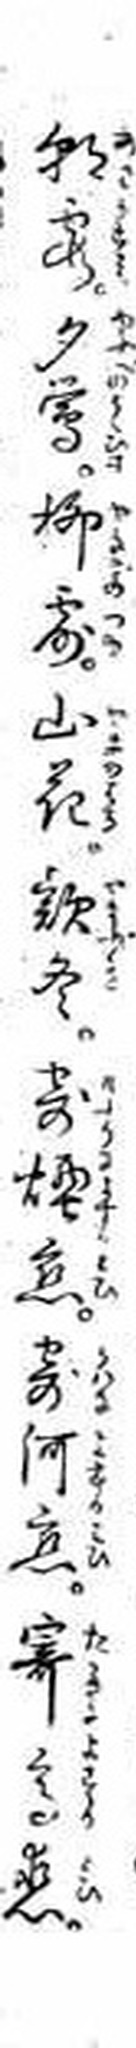朝霞。夕鴬。柳露。山花。款冬。寄煙恋。寄河恋。寄高恋。
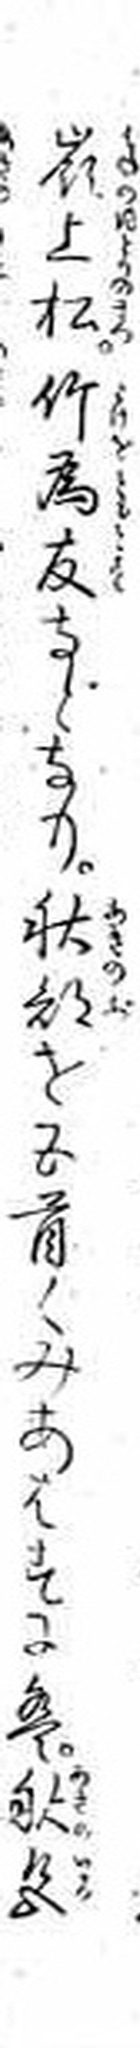嶺上松。竹為友などなり。秋部を五首くみあはすには。秋色
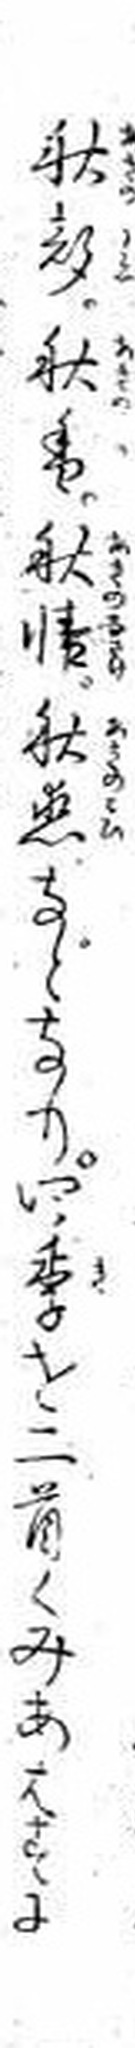秋声。秋香。秋情。秋恋などなり。四季を二首くみあはすに
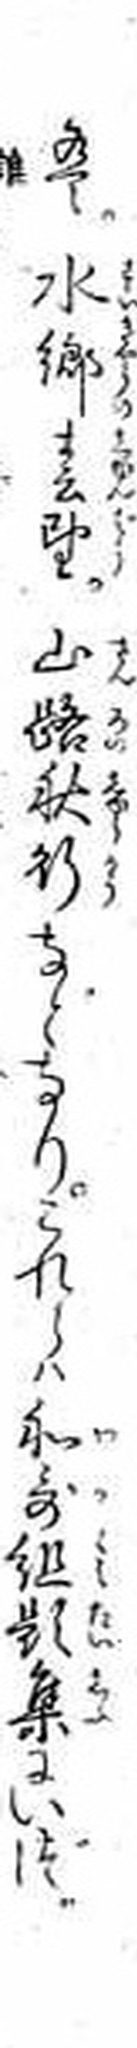は。水郷春望。山路秋行などなり。これらは和哥組題集にいず。
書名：女学範
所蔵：東京学芸大学教育コンテンツアーカイブ
